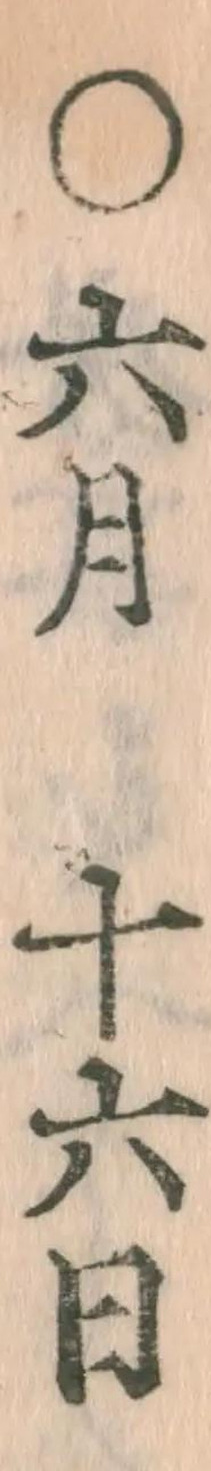〇六月十六日
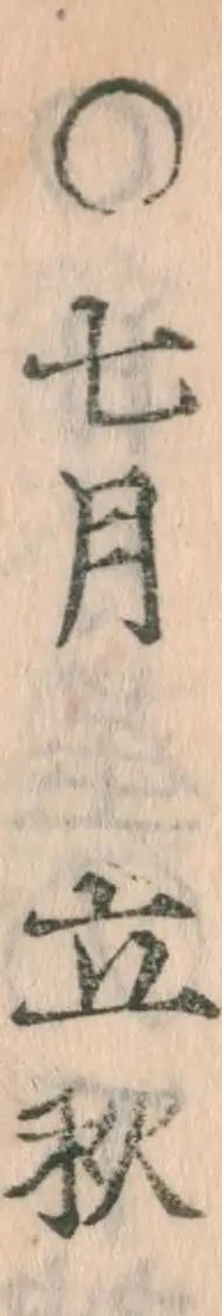〇七月立秋
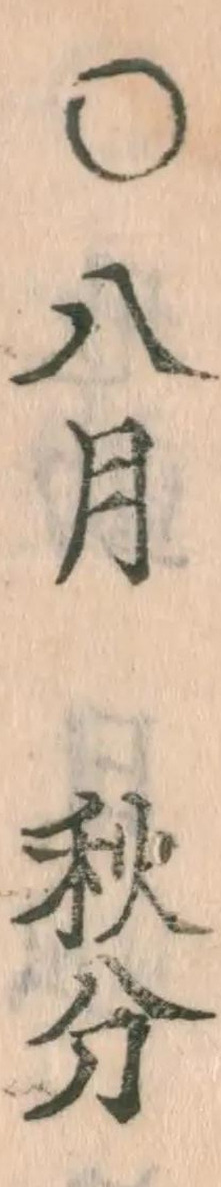〇八月秋分
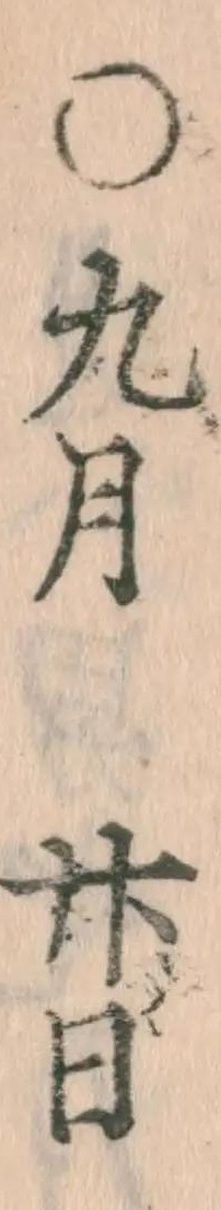〇九月廿日
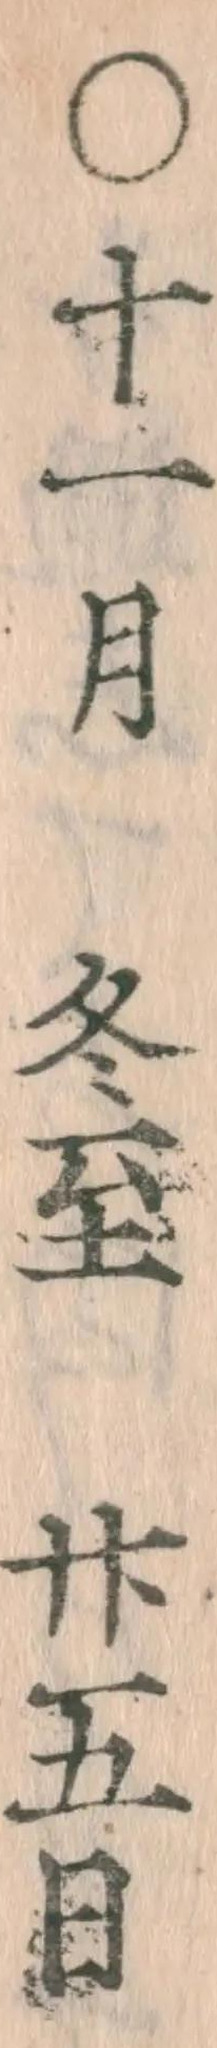〇十一月冬至廿五日
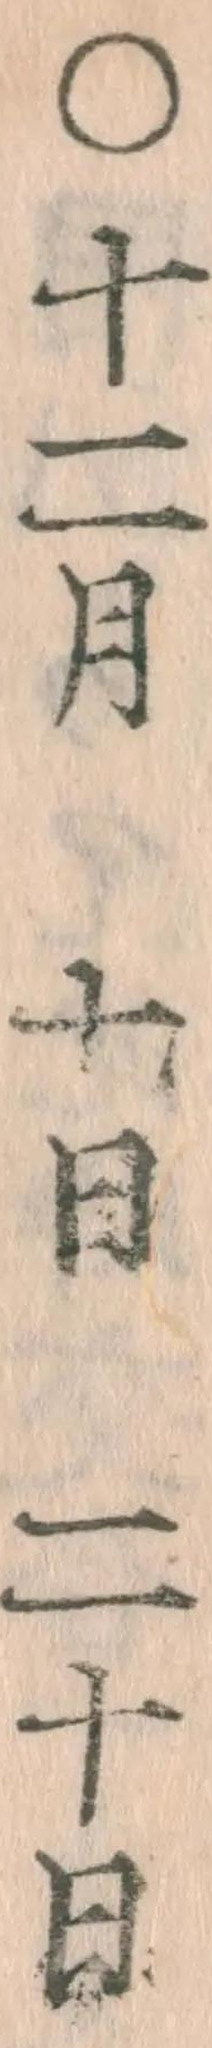〇十二月十日二十日
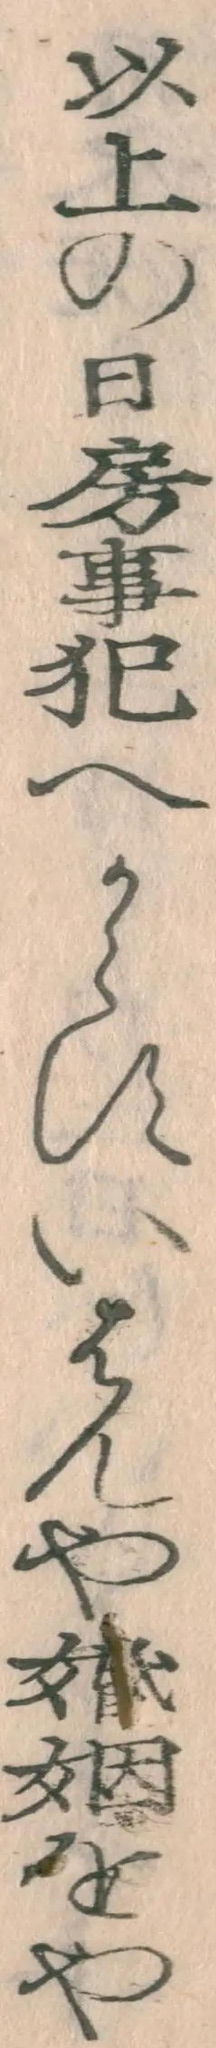以上の日房事犯へからす違反や婚姻をや
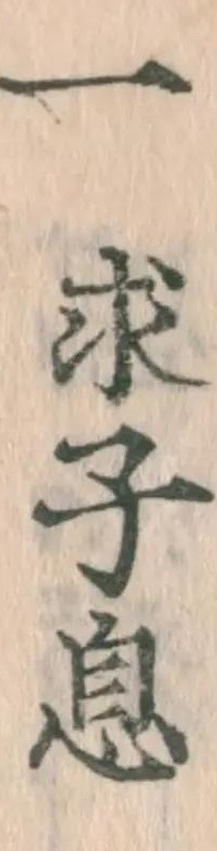一求子息
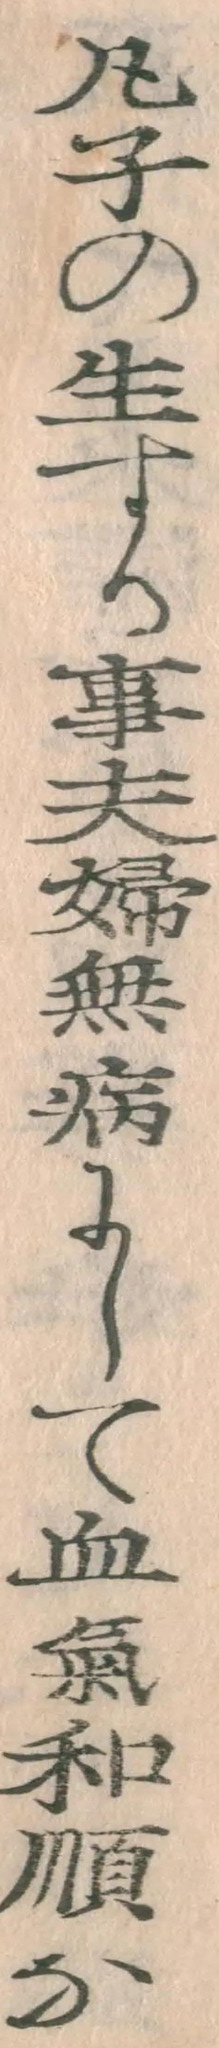凡子の生する事夫婦無病にして血気和順な
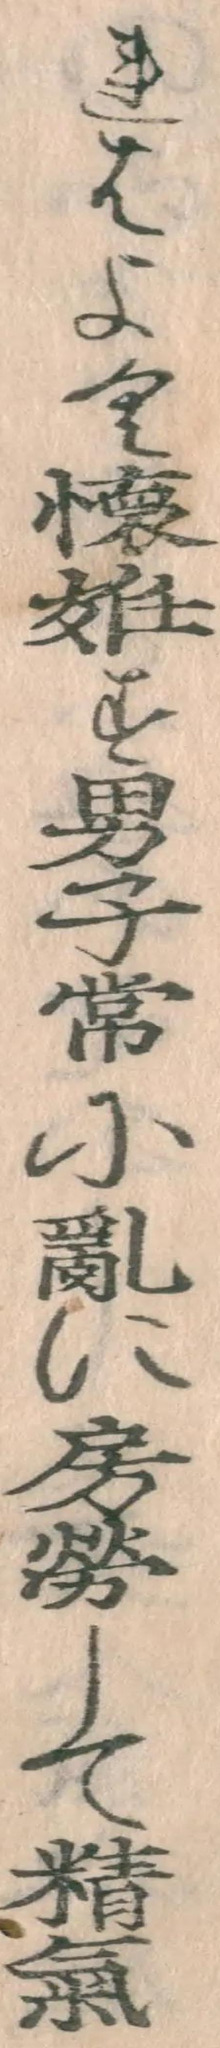れはよく懐妊す男子常に乱に房労して精気
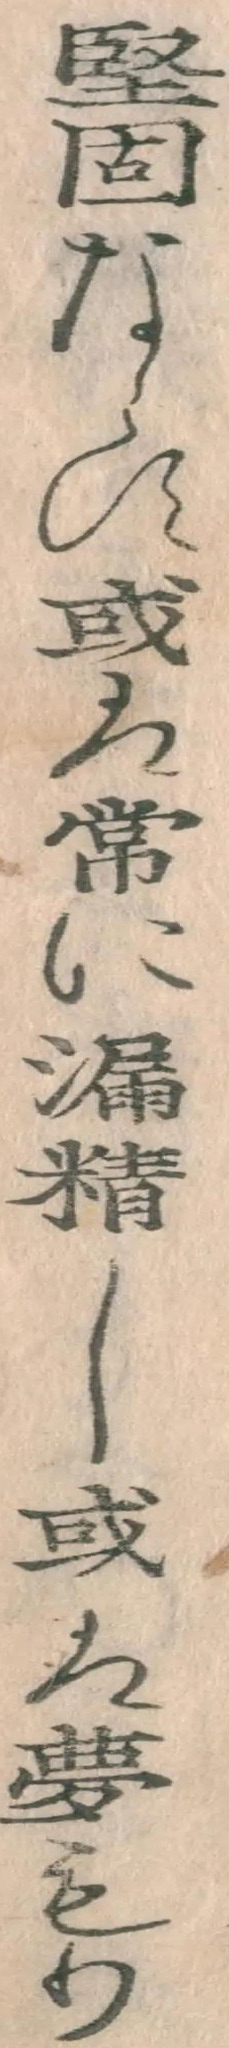堅固ならす或は常に漏精し或は夢もり

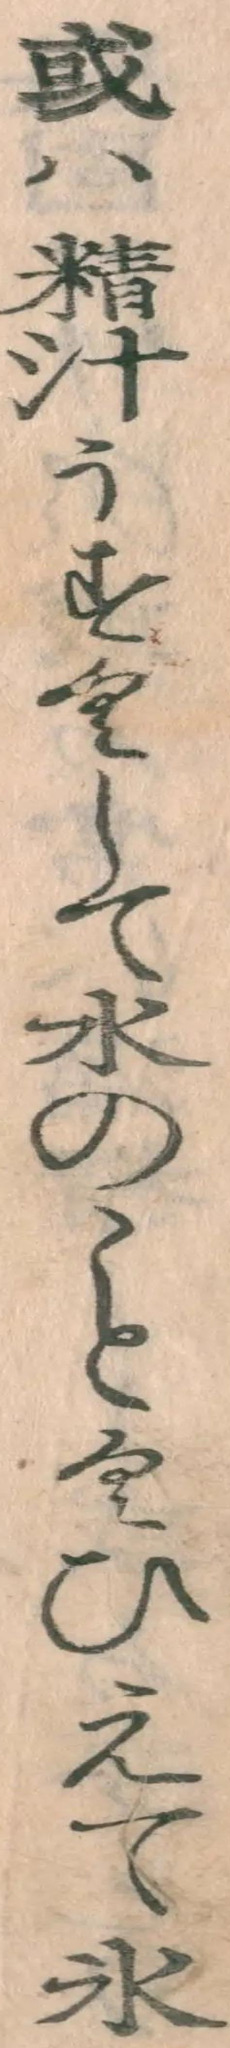或は精汁うすくして水のことくひえて氷
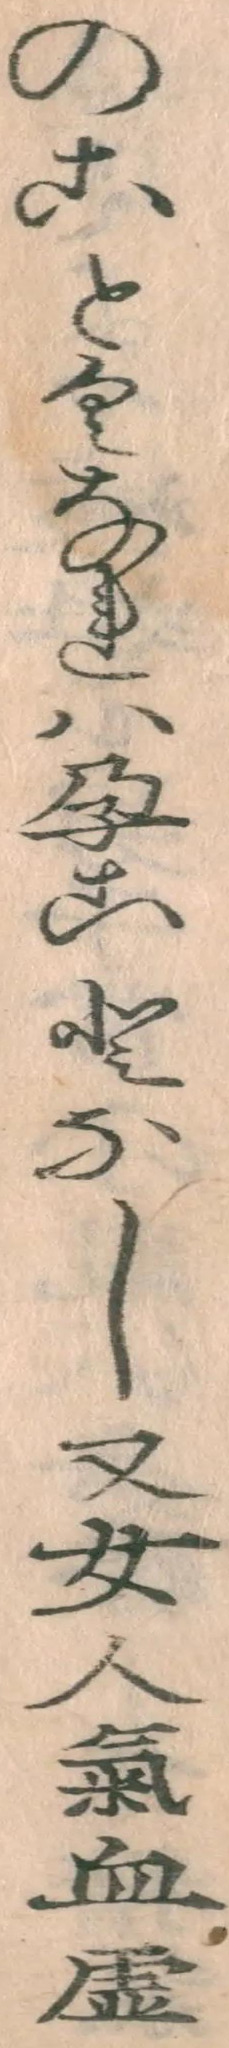のことくなれは孕ことなし又女人気血虚
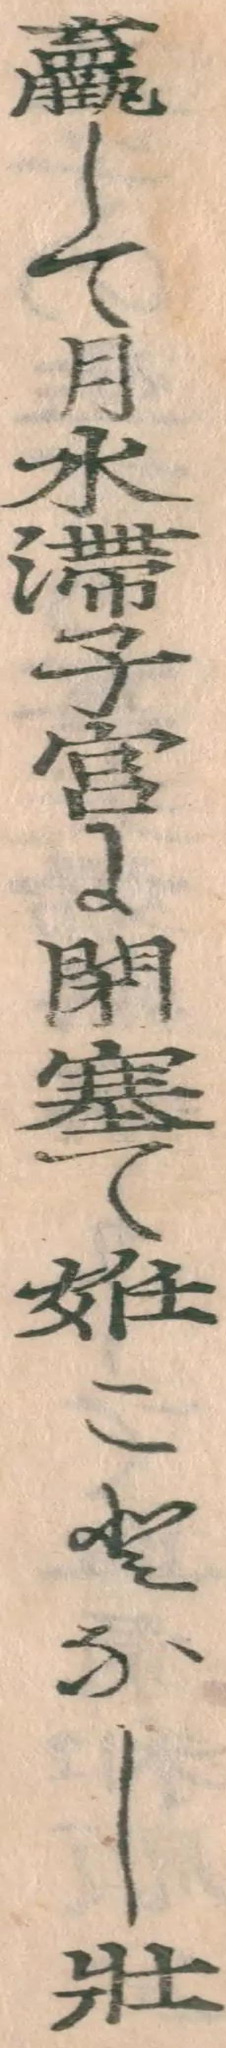羸して月水滞子宮に閉塞て妊ことなし壮
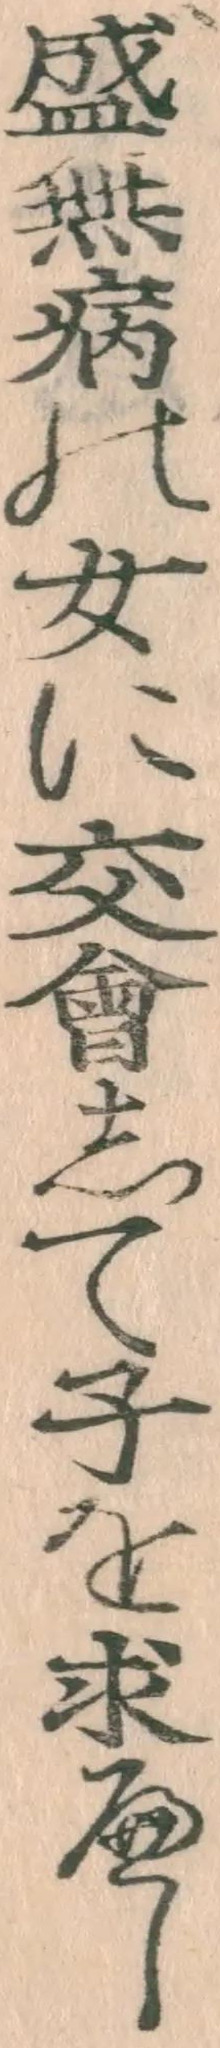盛無病の女に交会して子を求へし
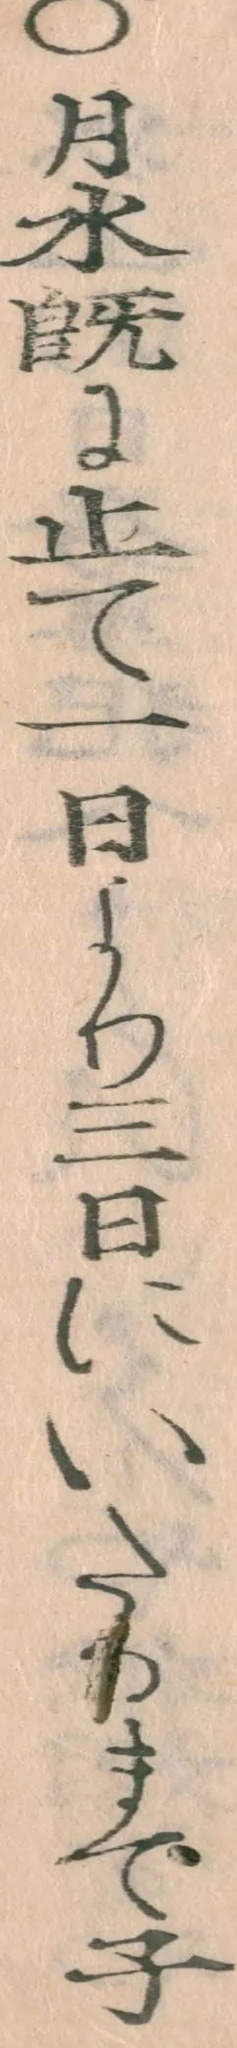〇月水既に止て一日より三日にいたるまで子
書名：延壽撮要
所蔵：国立国会図書館 National Diet Library, JAPAN
